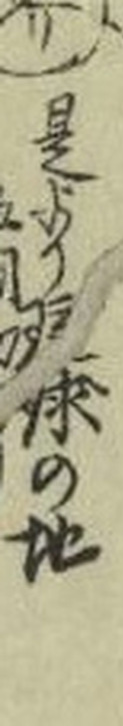是より琉球の地
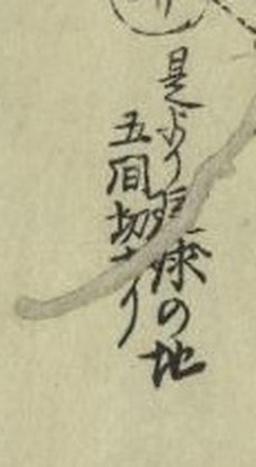五間切あり

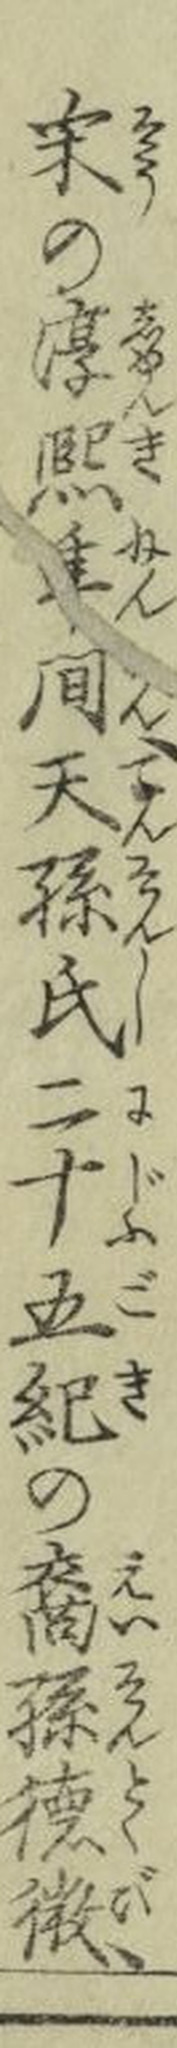宋の淳煕年間、天孫氏廿五紀の裔孫徳微、
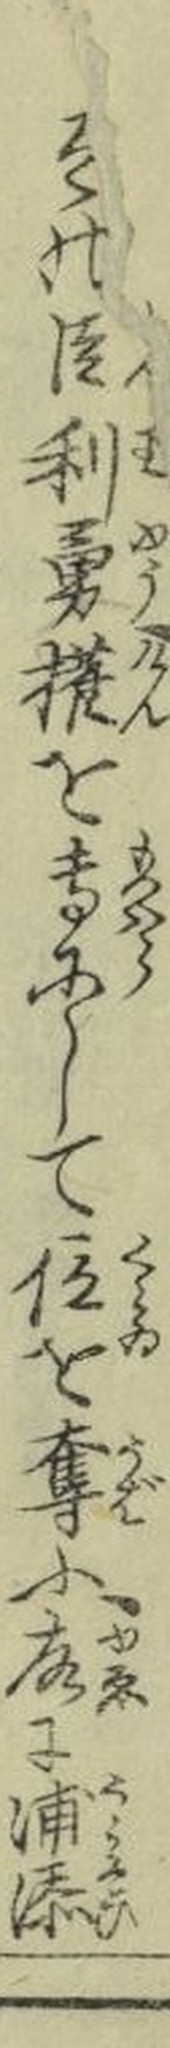その臣利勇、権を専にして位を奪ふ、故に浦添
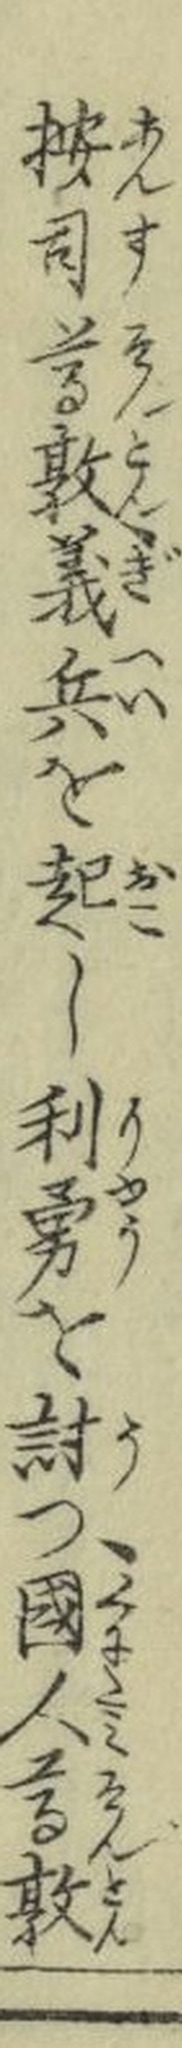按司尊敦、義兵を起し利勇を討つ、国人尊敦
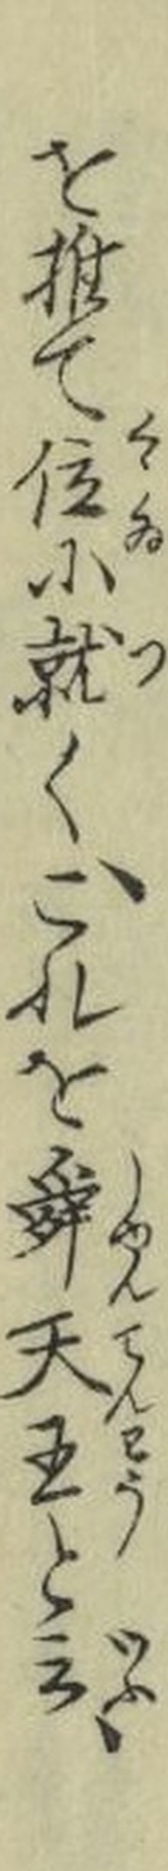を推て位に就く、これを舜天王と云、
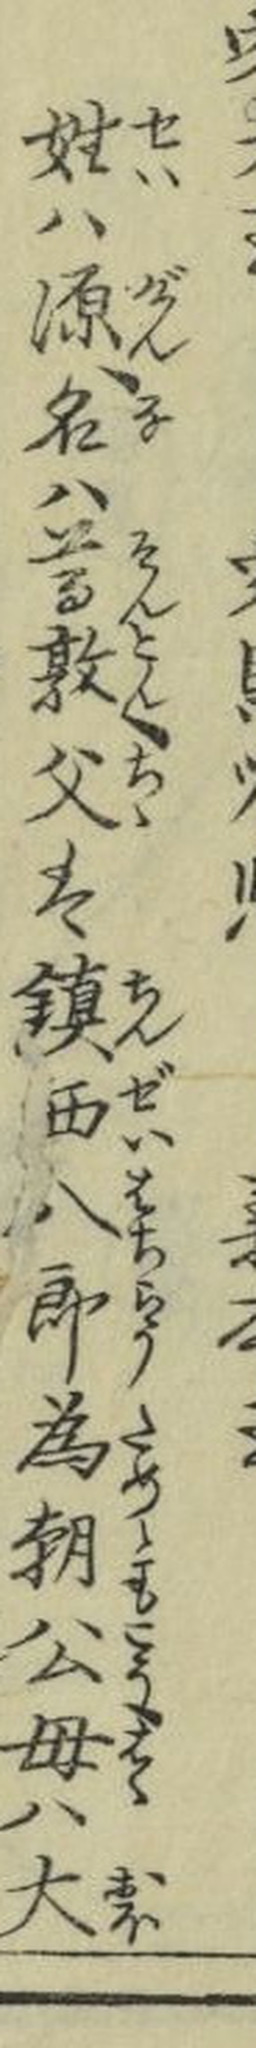姓は源、名は尊敦、父は鎮西八郎為朝公、母は大
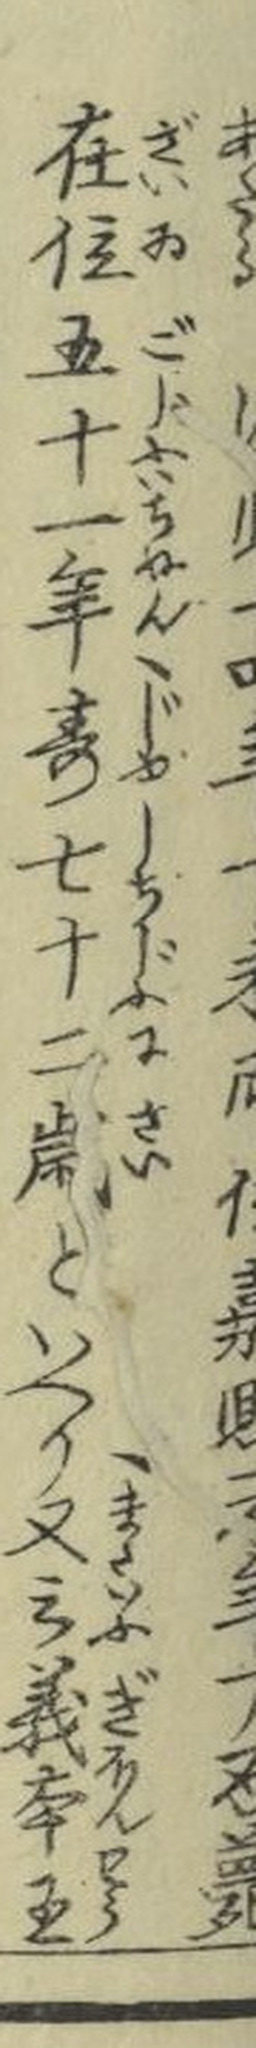在位五十一年、寿七十二歳といへり、又云義本王
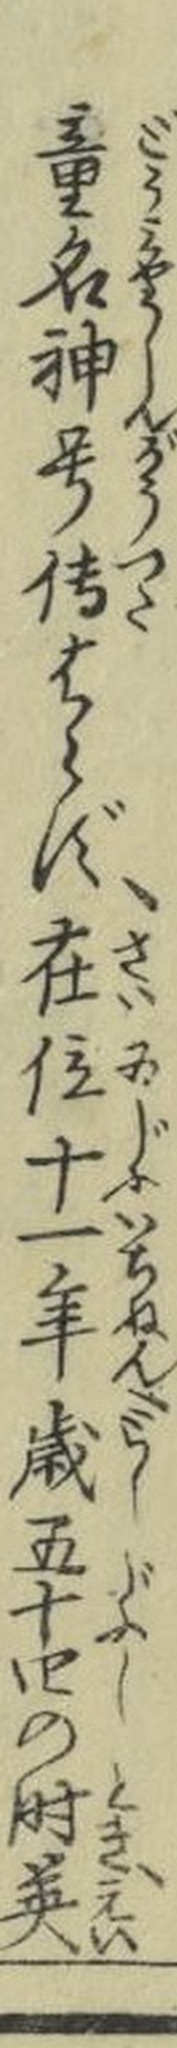童名神号伝はらず、在位十一年、歳五十四の時、英
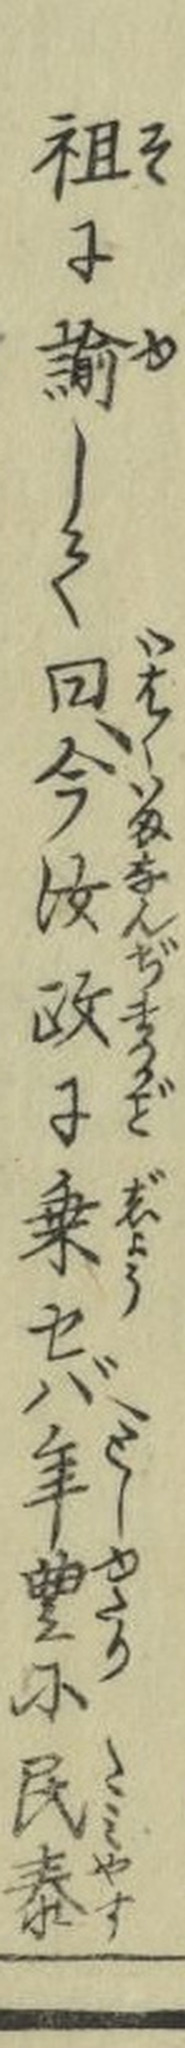祖に諭して曰、今汝政に乗せば、年豊に民泰
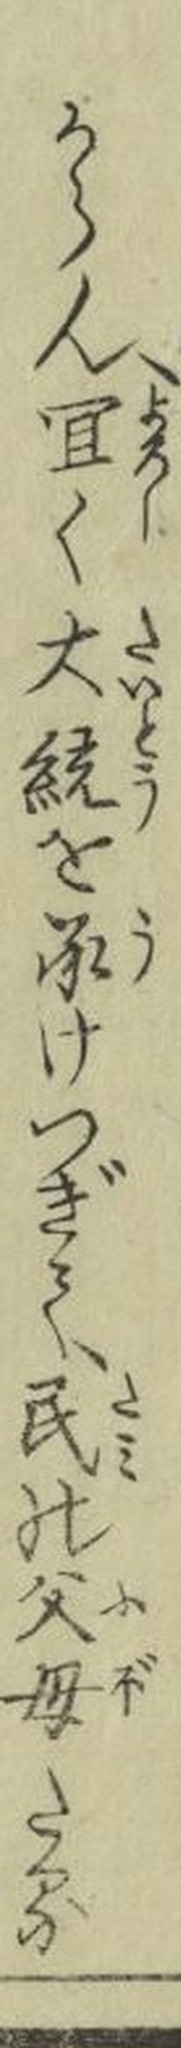からん、宜く大統を承けつぎて、民の父母たる
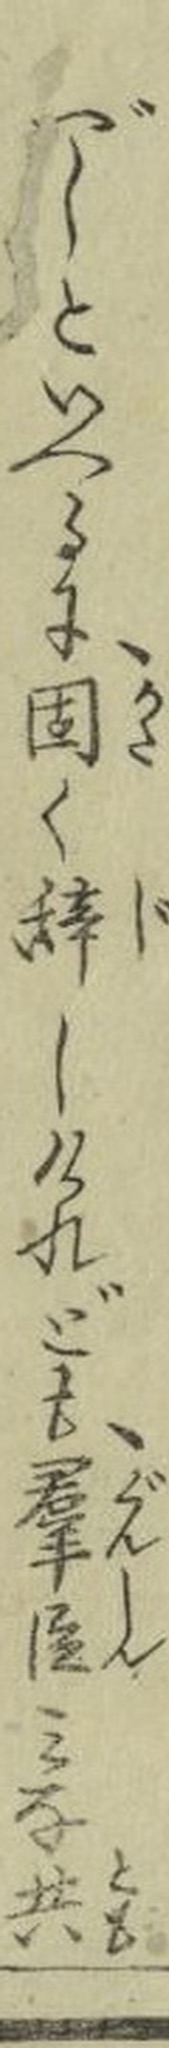べしといへるに、固く辞しけれども、群臣みな共
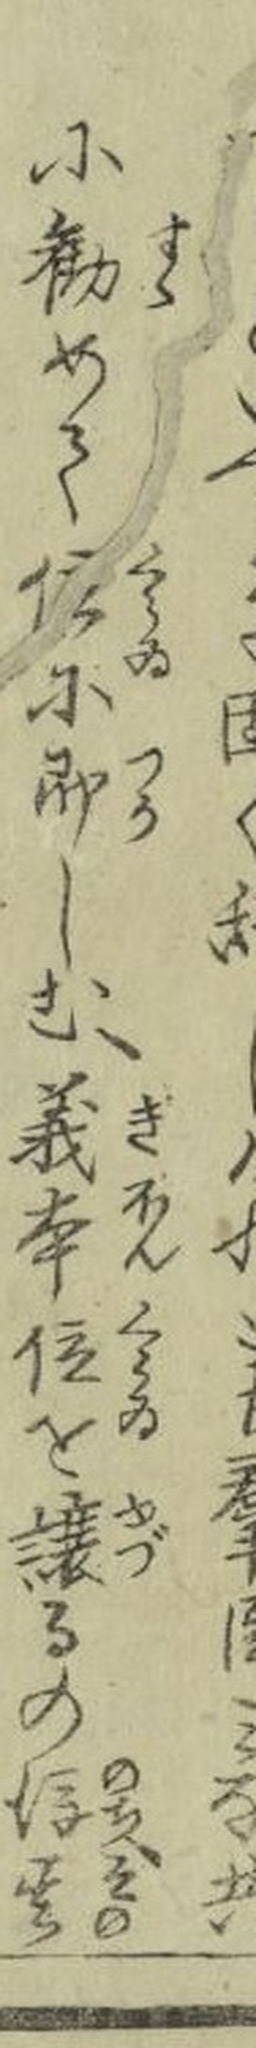に勧めて位に即しむ、義本位を譲るの後、其
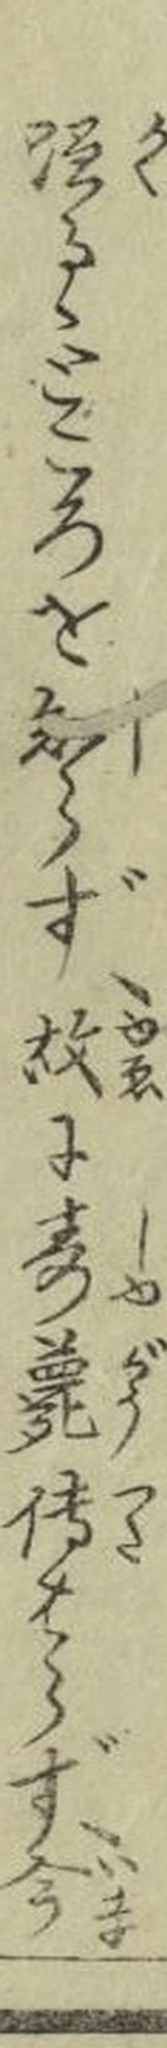隠るゝところを知らず、故に寿薨伝はらず、今

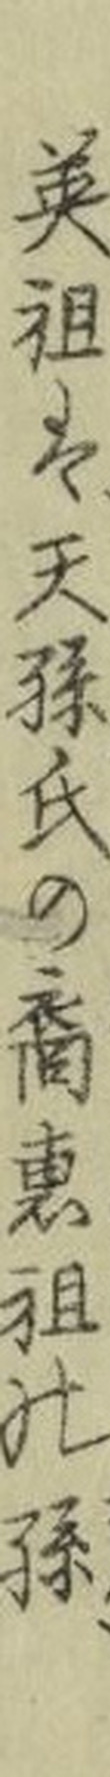英祖は、天孫氏の裔、恵祖の孫、│
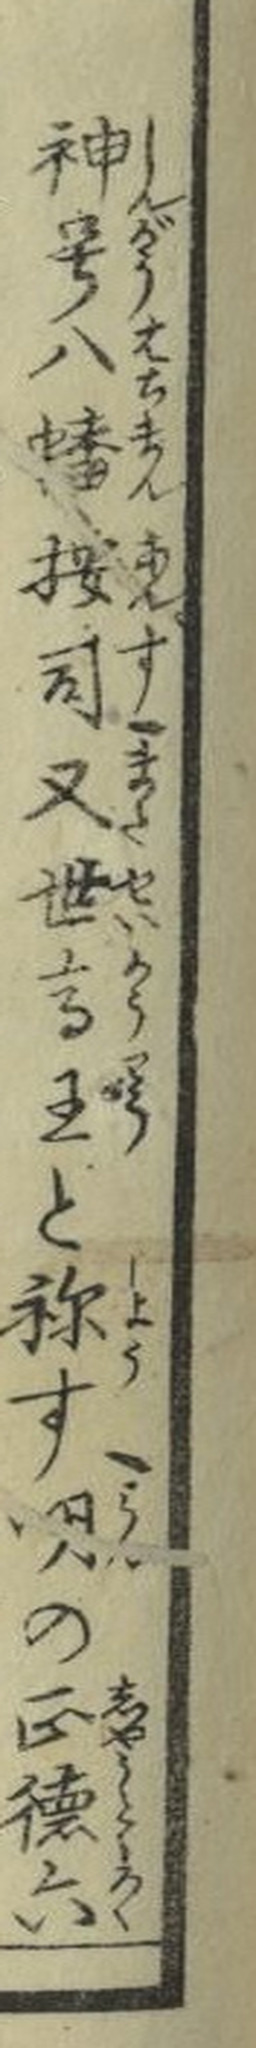神号八幡按司、又世高王と称す、明の正徳六
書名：琉球入貢紀略
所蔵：University of the Ryukyus Library
